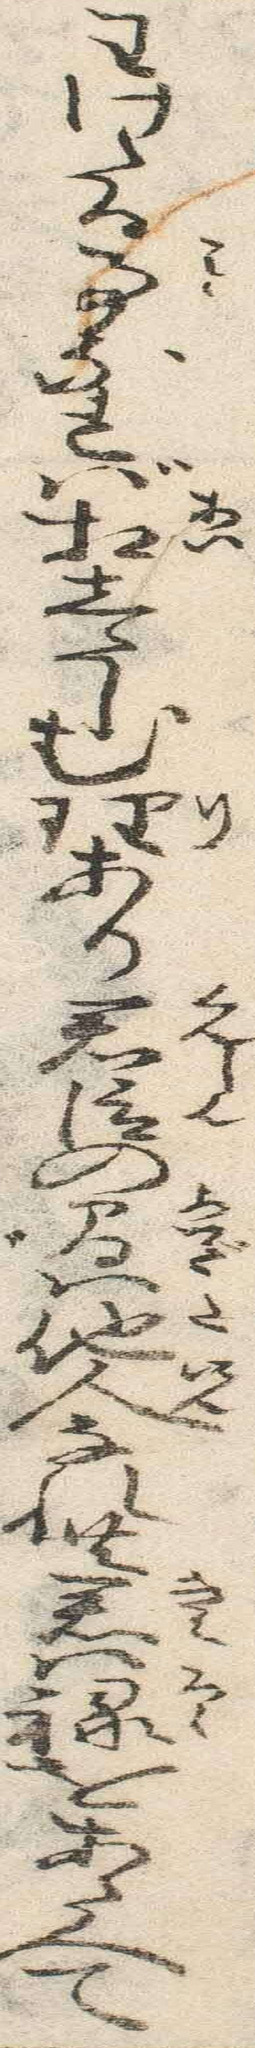わけたる事なれば相したしむ理あり君臣の間は他人なれ共君は禄をあたへて
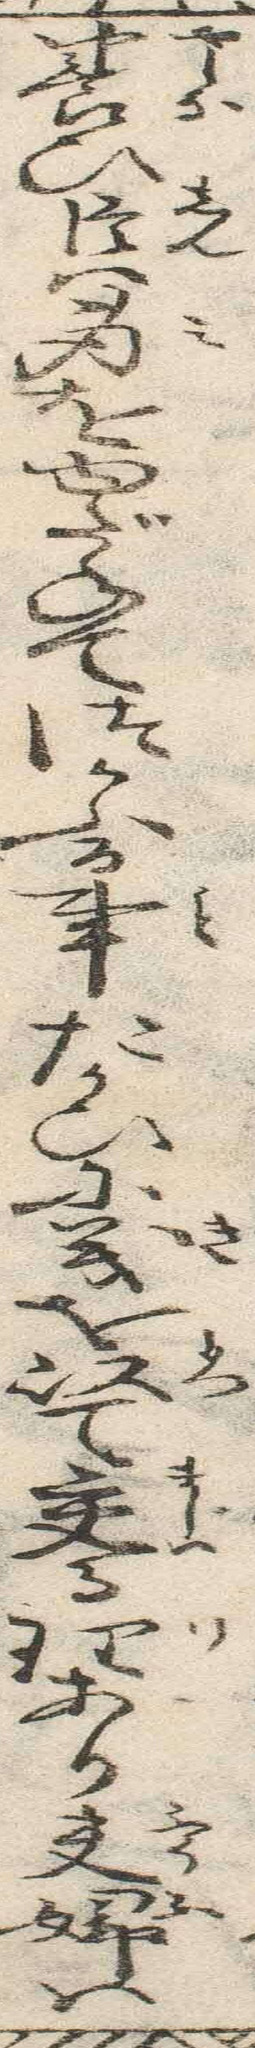養ひ臣は身をゆだねてつかふる事たかひに義を以て交る理あり夫婦は
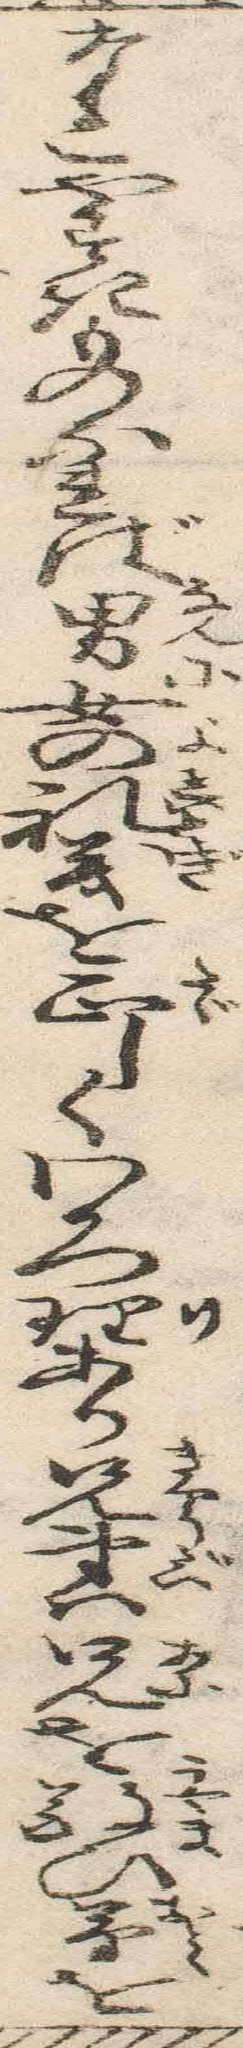なれやすきものなれば男女の礼義を正しくわかつ理あり兄弟は兄を敬ひ弟を
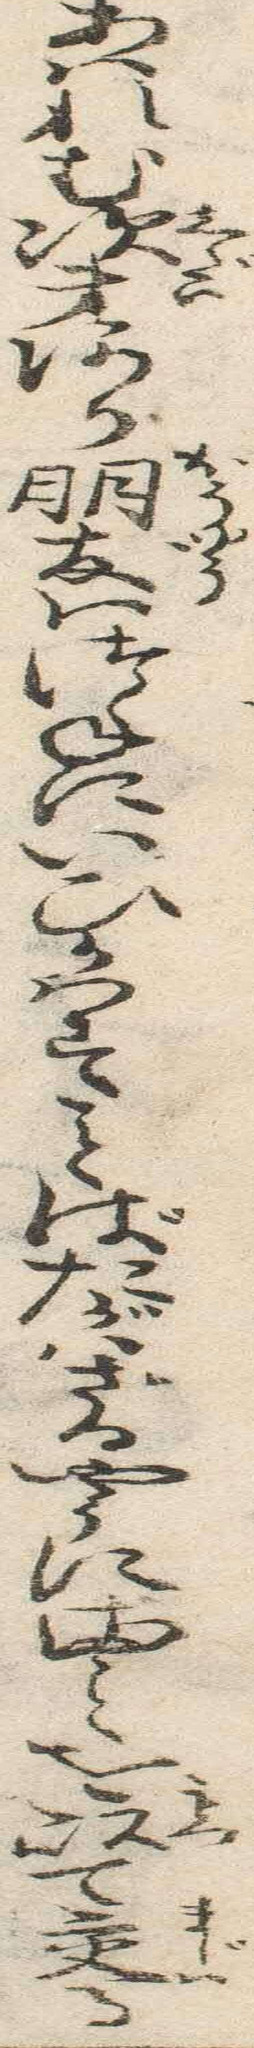あはれむ次第あり朋友はつねにいひかはすことばたがはざるやうにまことを以て交る
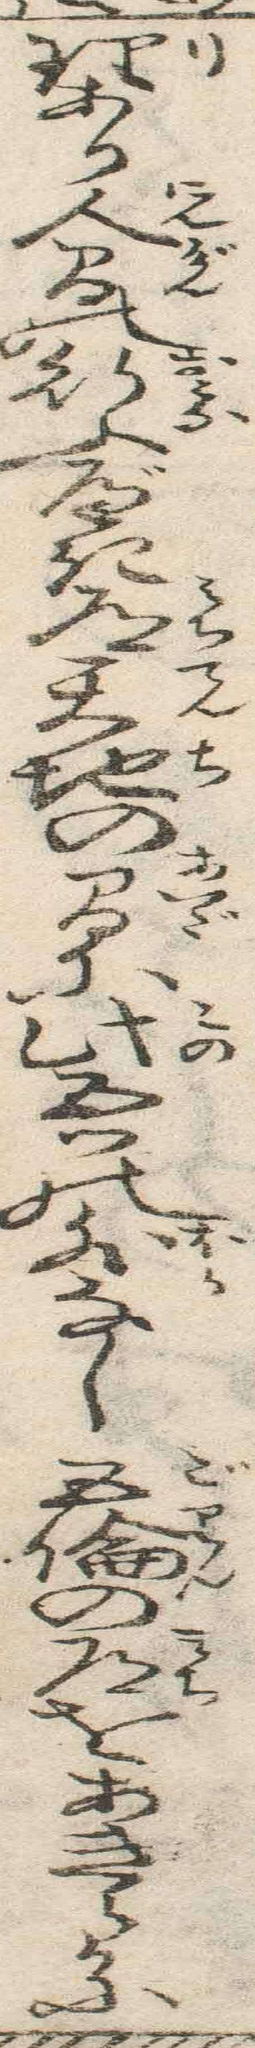理あり人間の行ふべき道天地の間に此五つの外なし五倫の道をあきらかに
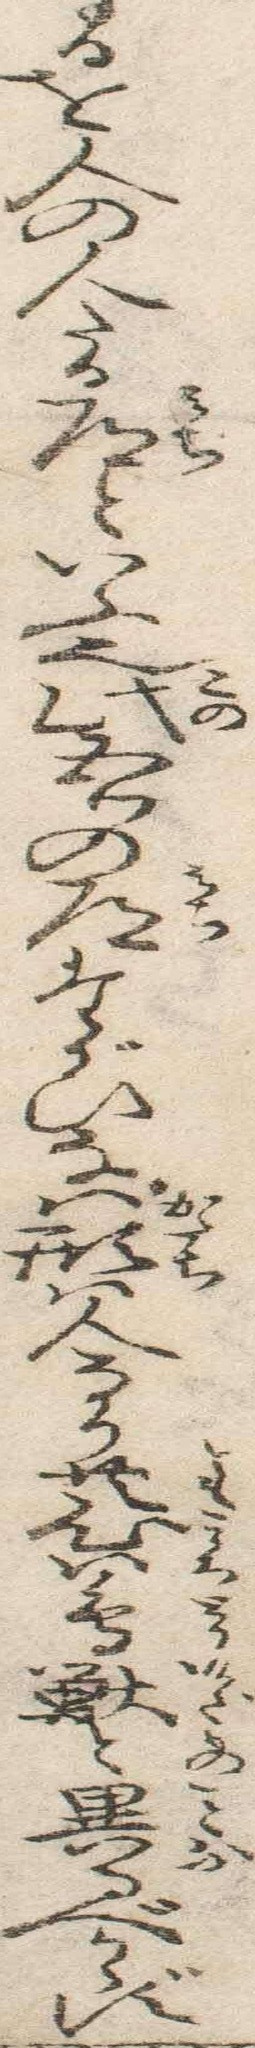するを人の人たる道といふ也此五つの道たがひなば形は人なり共心は鳥獣と異るべからず
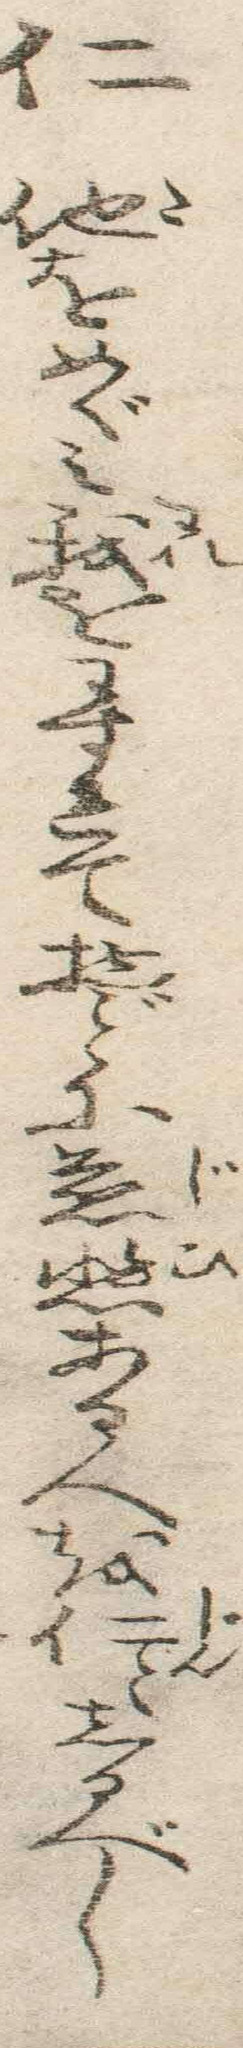仁他をめぐみ我をわすれて物ごとに慈悲ある人を仁としるべし
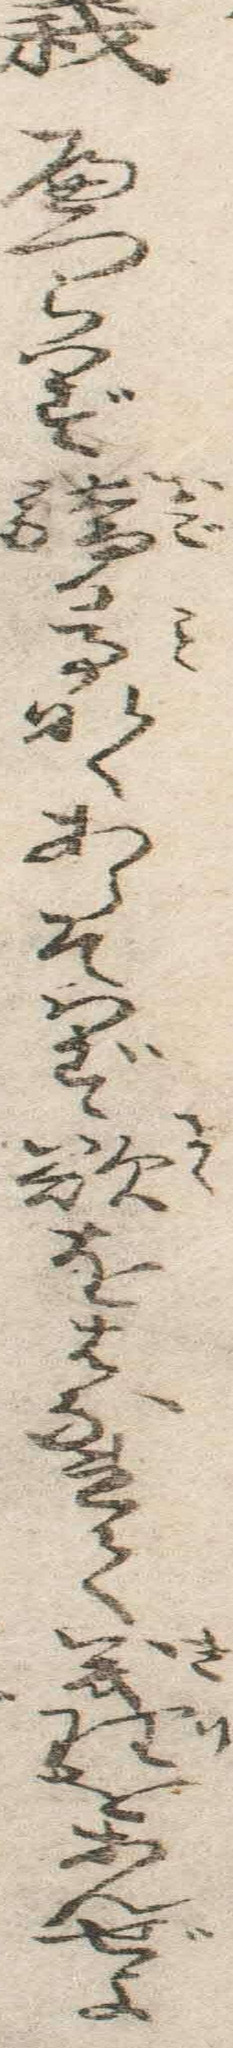義へつらはず驕る事なくあらそはず欲をはなれて義理をあんぜよ
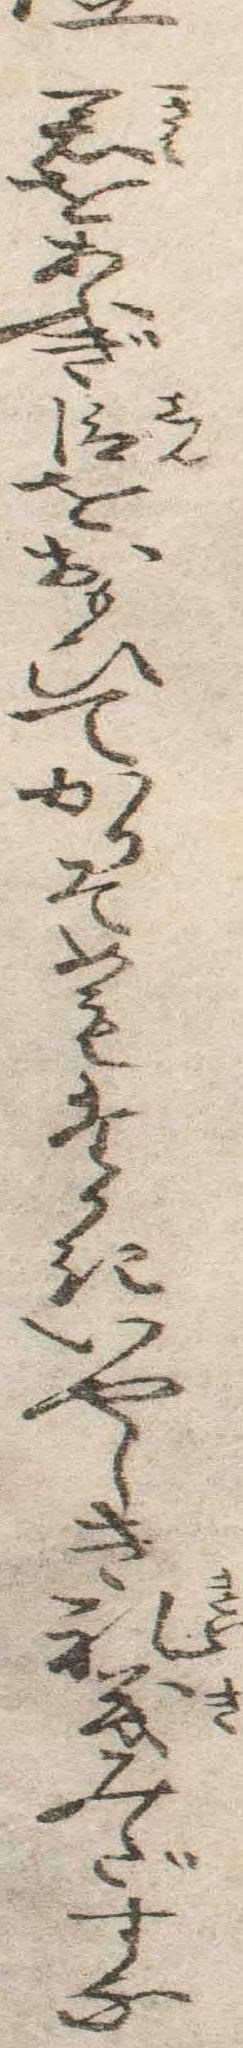礼君をあふぎ臣をおもひてかりそめもたかきいやしき礼義みだすな
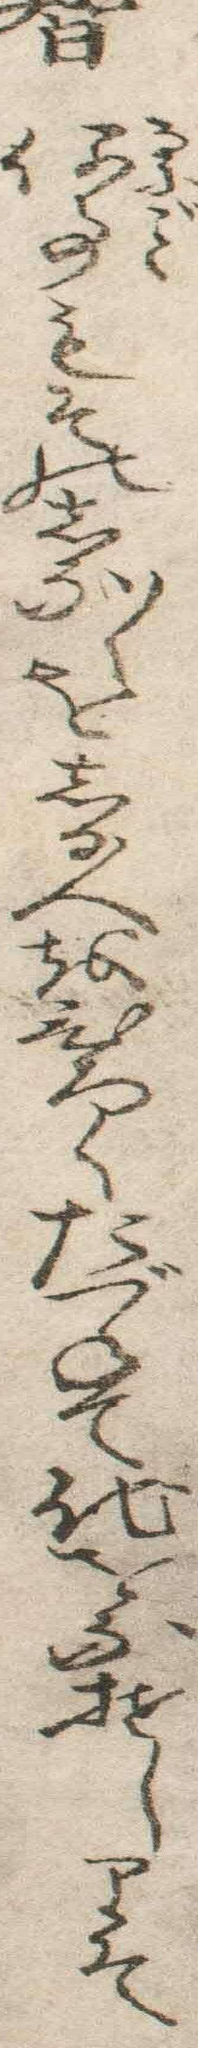智何事もそのしな〳〵をしる人をひろくたづねて他をなそしりそ
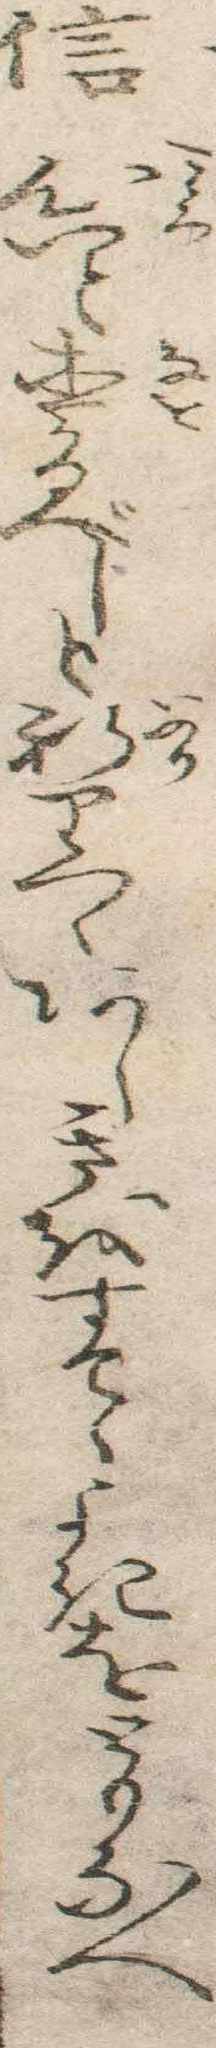信心いと直かるべしと祈りつゝあしきをすてゝよきをともなへ

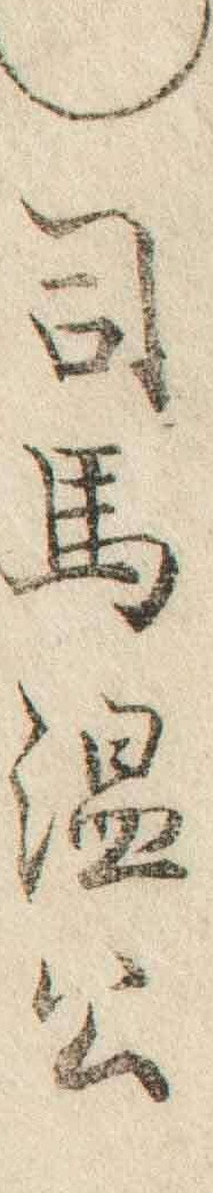〇司馬温公
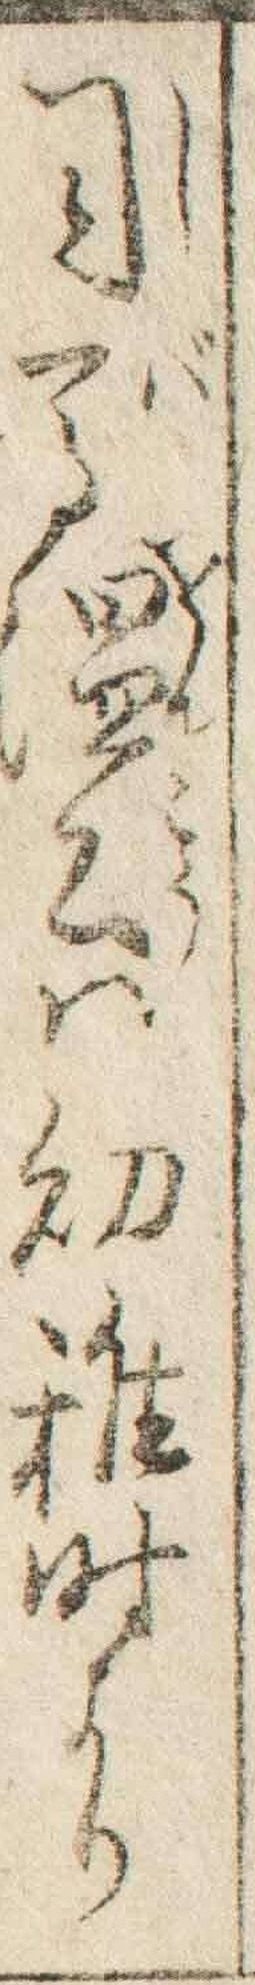司馬温公は幼稚時より
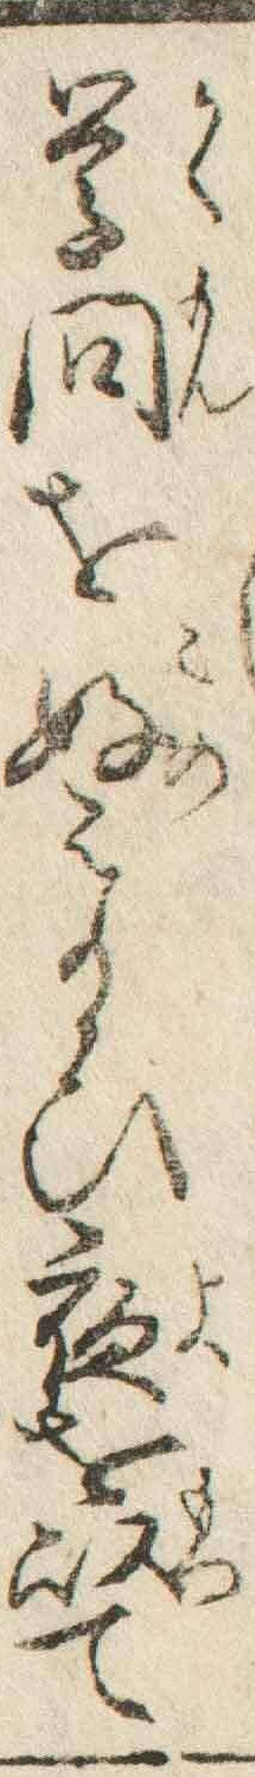学問を好み給ひ夜を以て
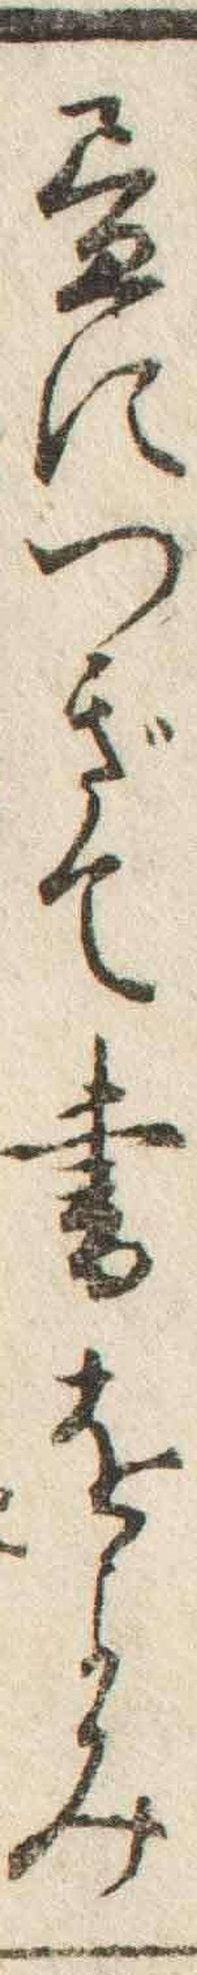昼につぎて書をよみ
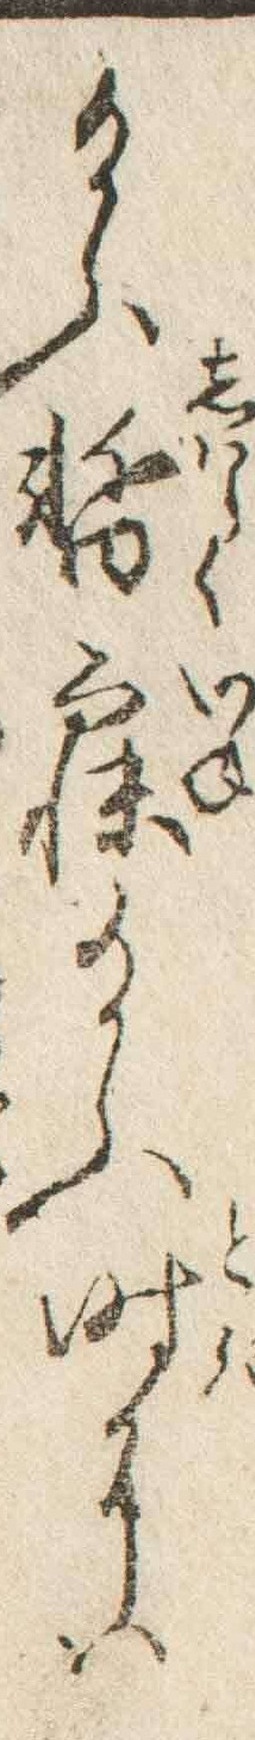給ふ暫寝給ふ時には
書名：撫育草
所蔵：東京学芸大学附属図書館 国文学研究資料館
